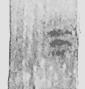三
